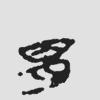日月
